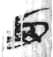西
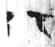北
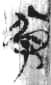貧
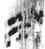三
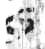月
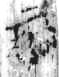啓
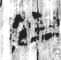於
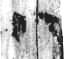北
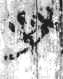○（得）
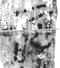正
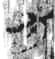方
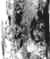非
